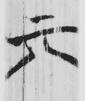亓
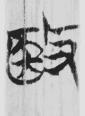殹
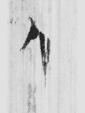人
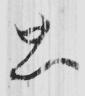也
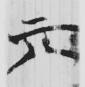亓
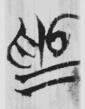爲
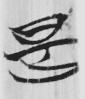是
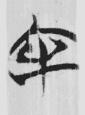牢
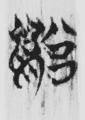{鼠予}
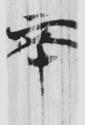不
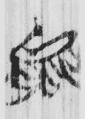能
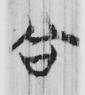同
